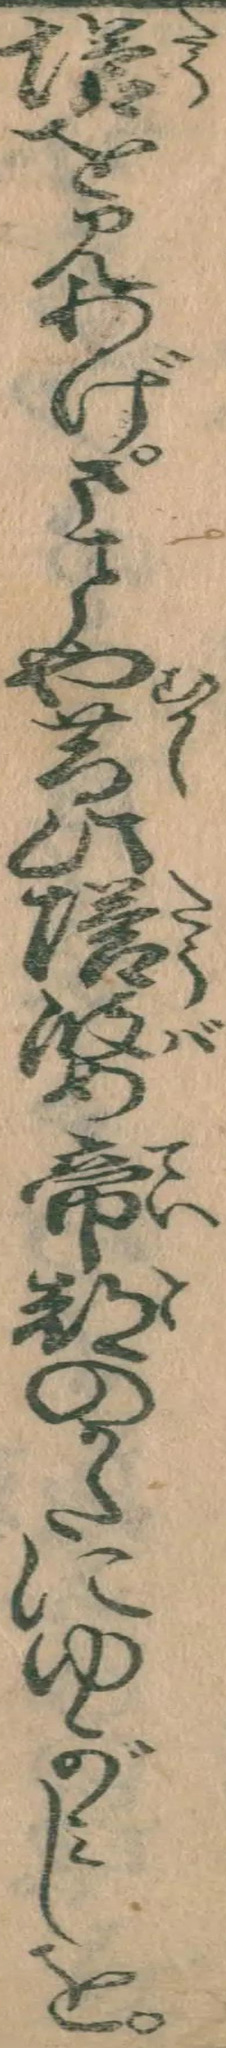塔を見あげ。まさや昔此塔婆帝都のかたにゆがみしを。
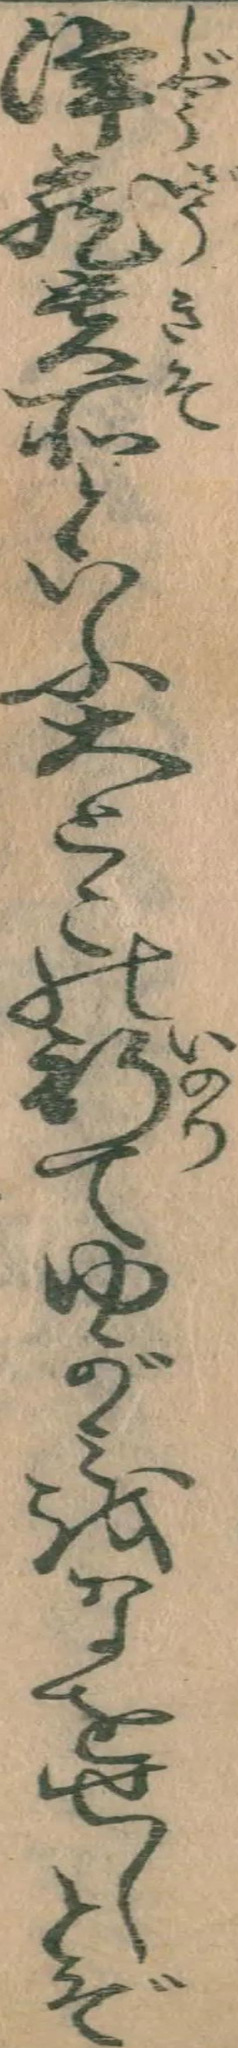浄蔵貴所といふ大とこの祈てゆがみをなをせしとぞ
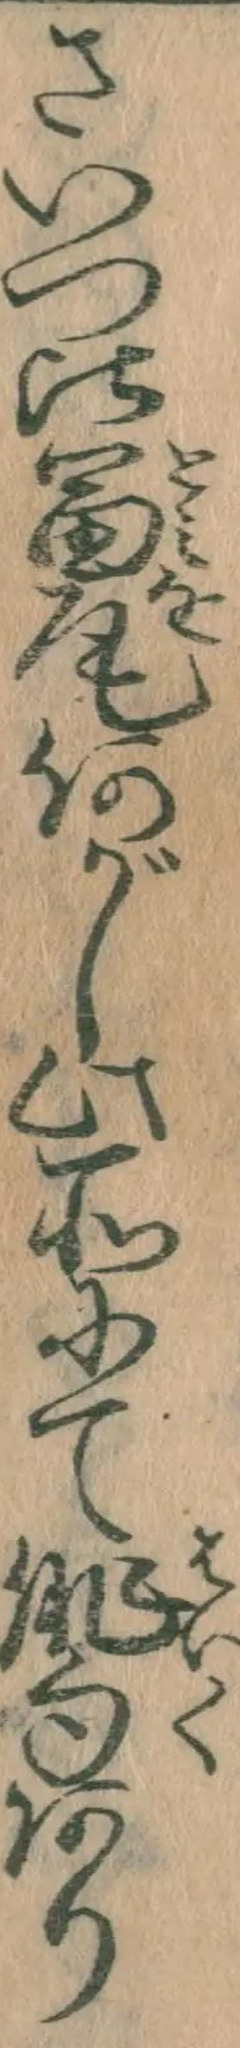さいつ比富尾何がし此所にて俳句あり
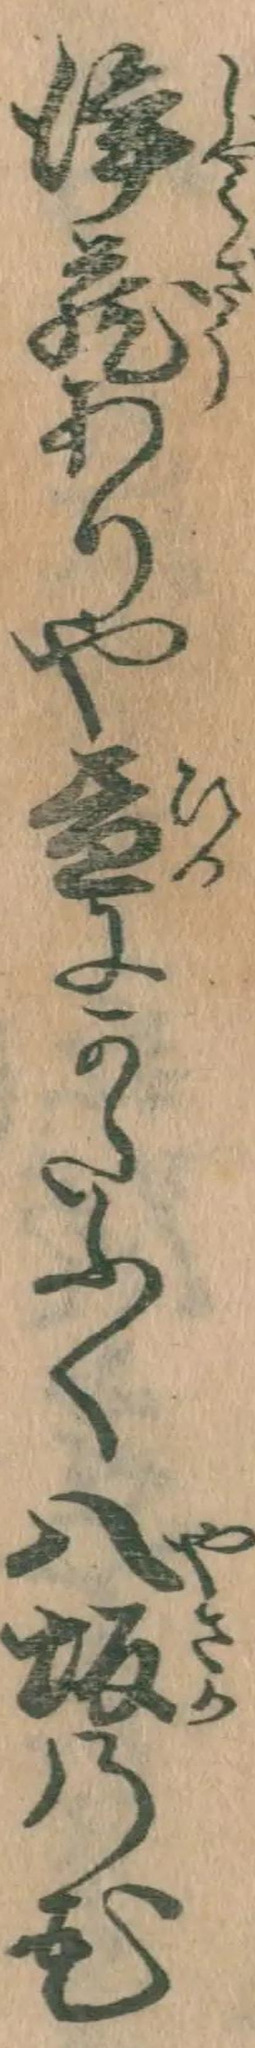浄蔵ありや昼にかたふく八坂の花
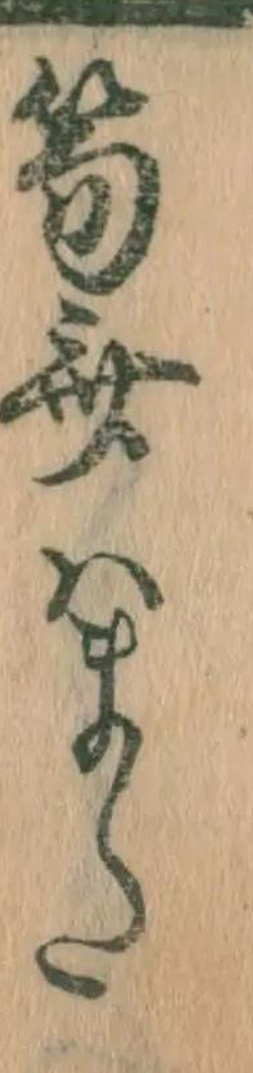筍斎はまた
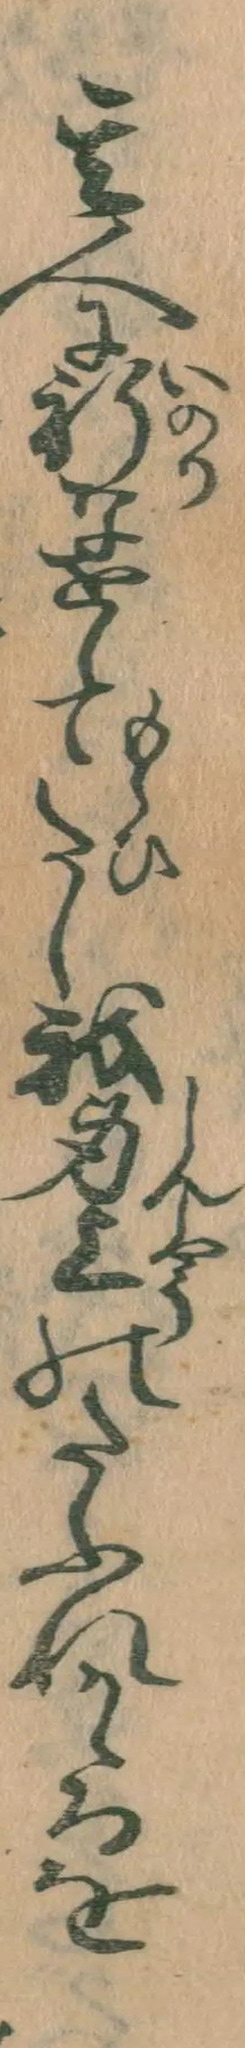其人に祈なをしてもらひたし我身上のたふれかゝるを
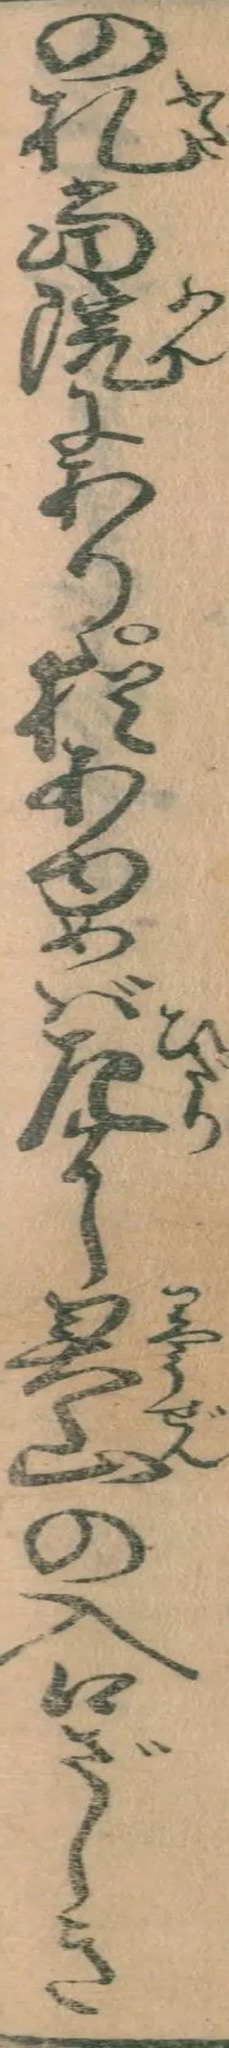の札当院にあり。猶あゆめば左に霊山の入口ざしき
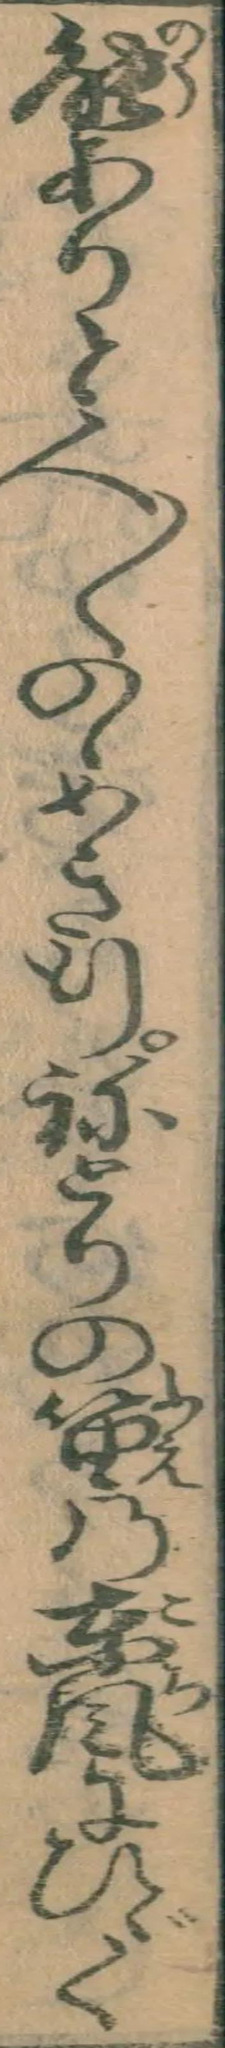能ありと人々のゝめき行。ねとりの笛の東風にひゞく
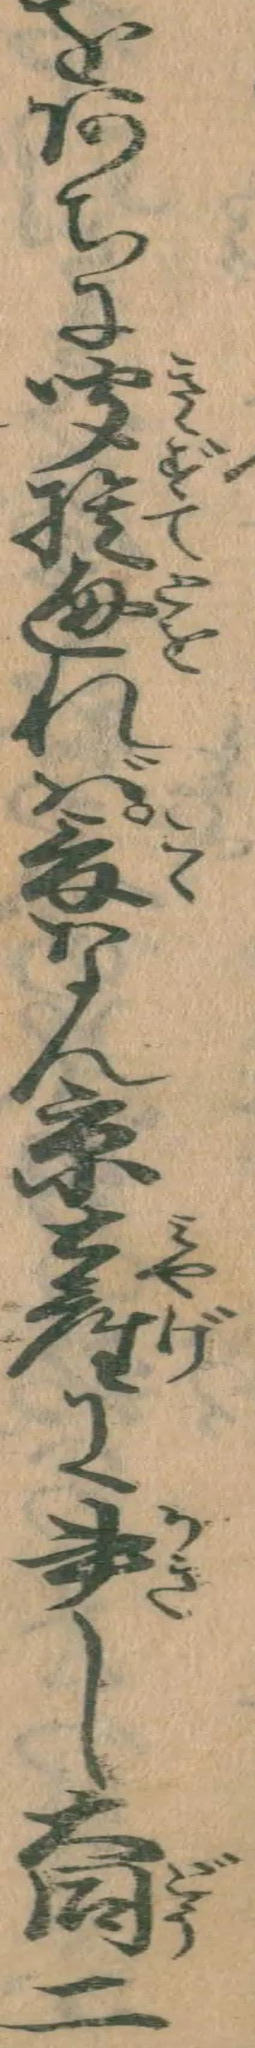をあちに聞捨通れば。爰なん京土産に書し大同二
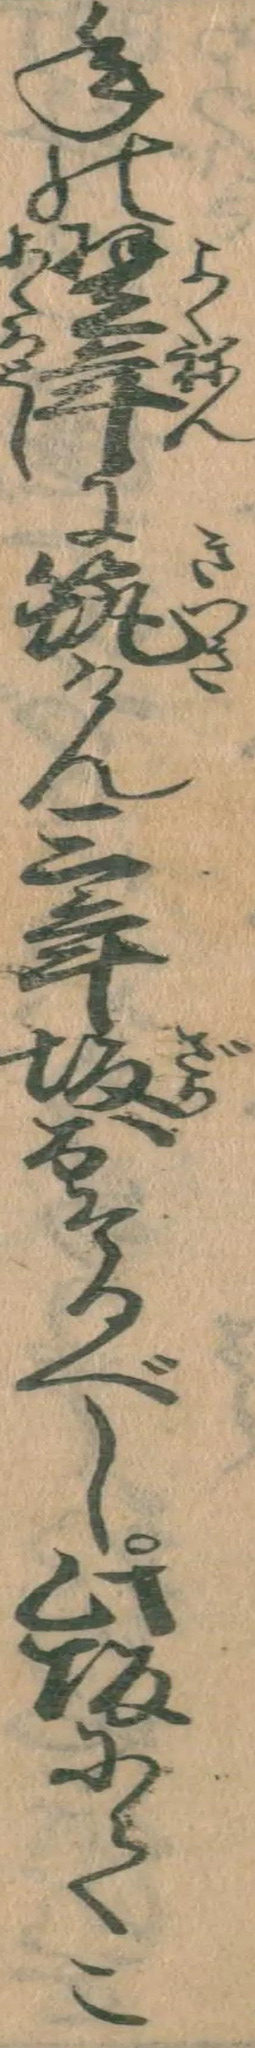年の翌年に筑けん三年坂おそるべし。此坂にてこ
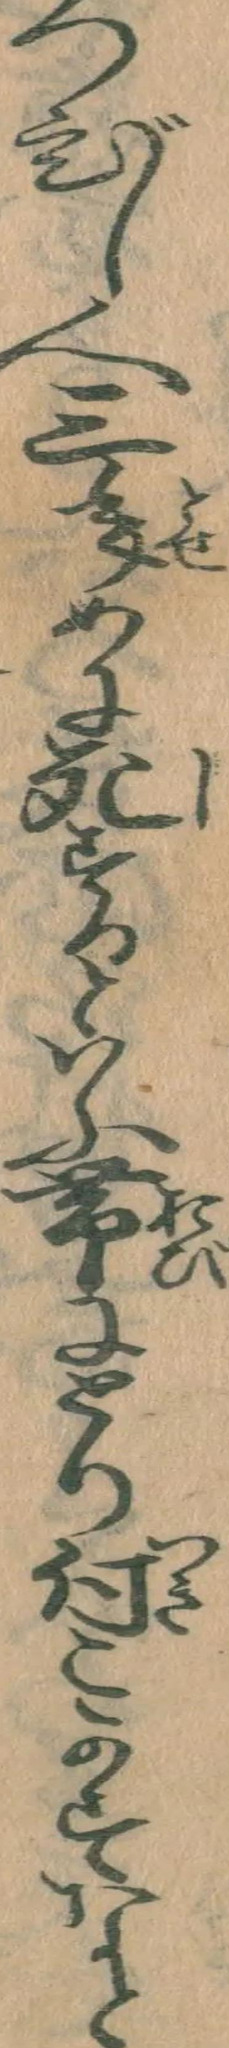ろびし人三年めに死するといふ帯にとり付こかすなと
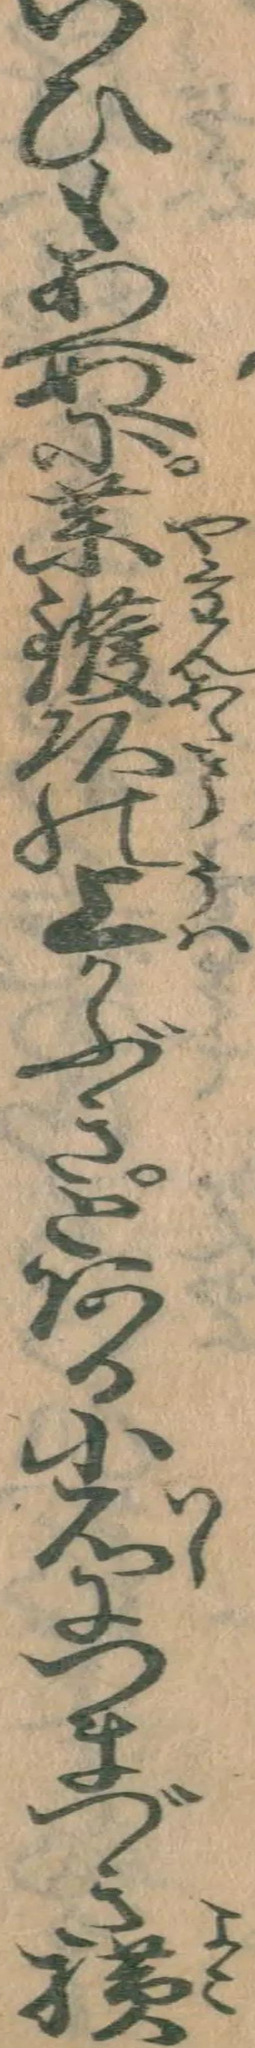いひもあへぬに。薬缶頭の上かぶき。とある小石につまづき横
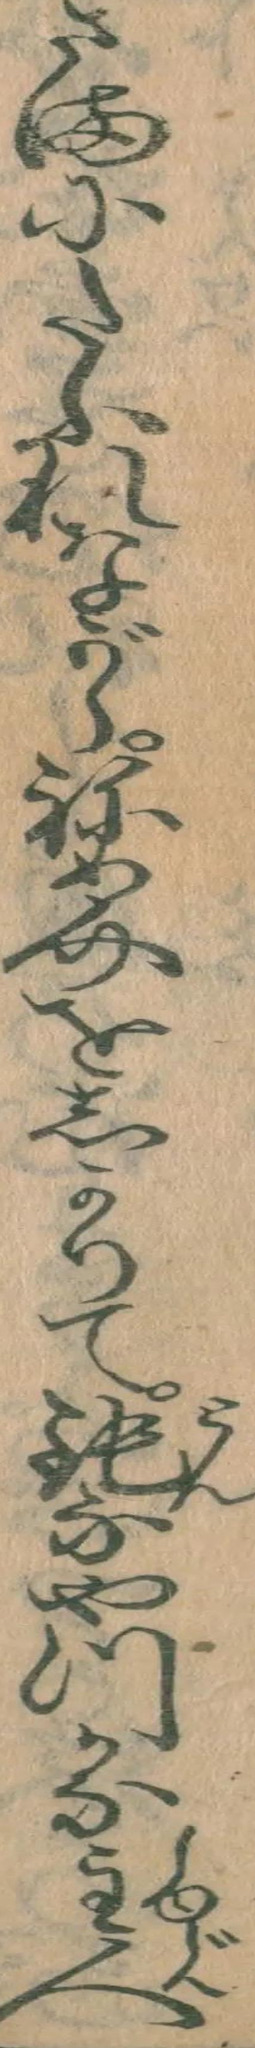さまにたふれながら。ねめ介をしかりて。鈍なやつかな主人
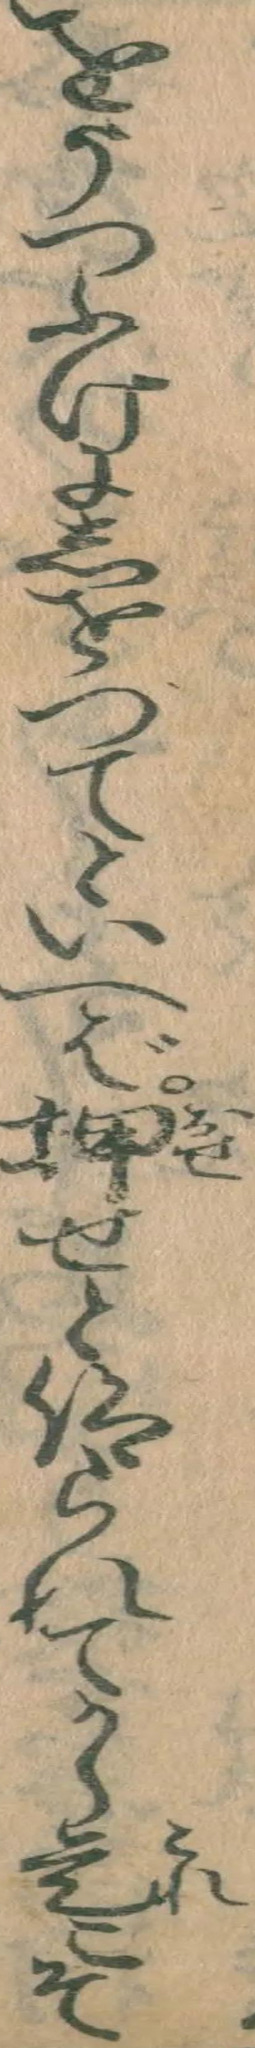をうつふけにしをつてといへば。押せと仰られてから是こそ
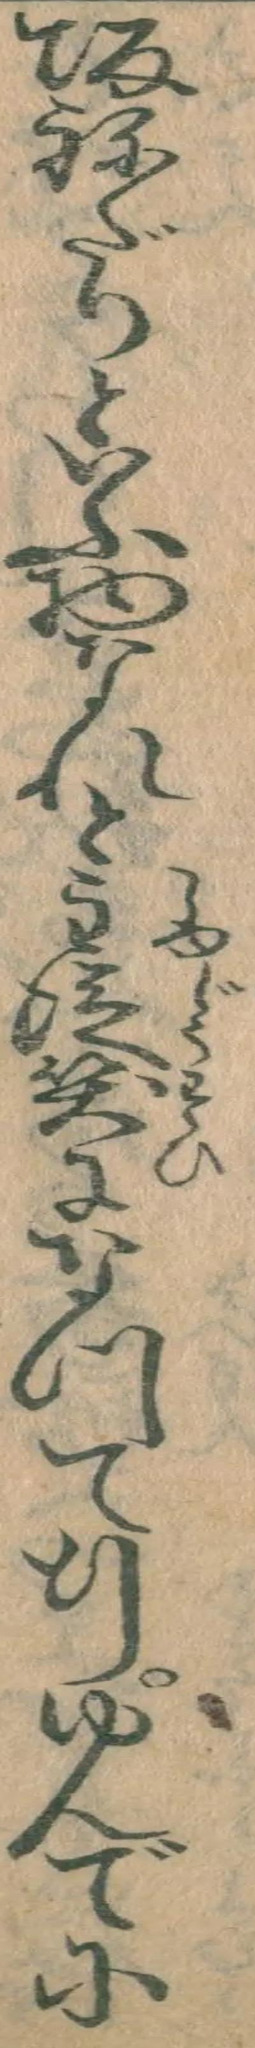坂ねだりといふ物なれと主従笑になつて行。ゆんでに
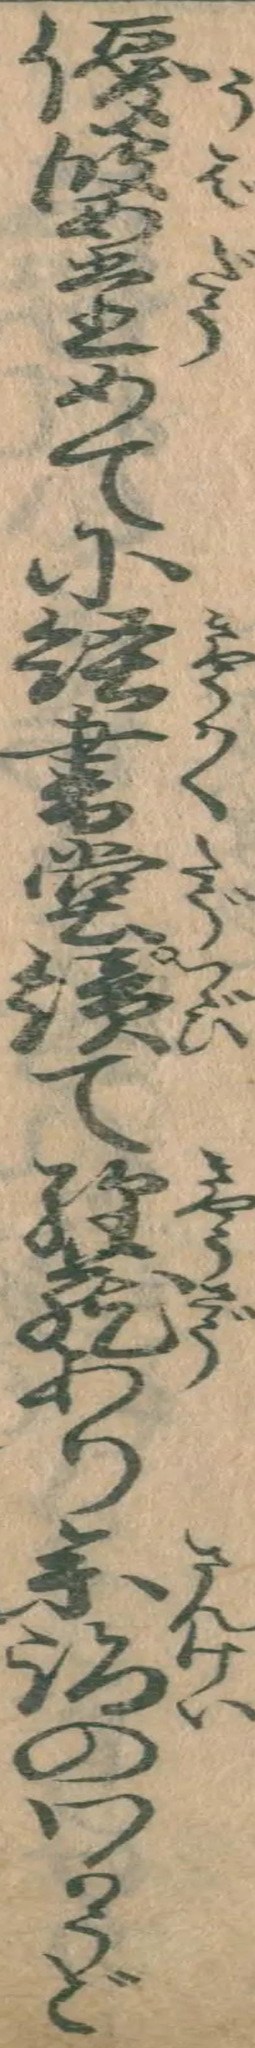優婆堂めてに経書堂。続て経蔵あり参詣のわかうど
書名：新竹斎 5巻
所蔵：国立国会図書館 National Diet Library, JAPAN
